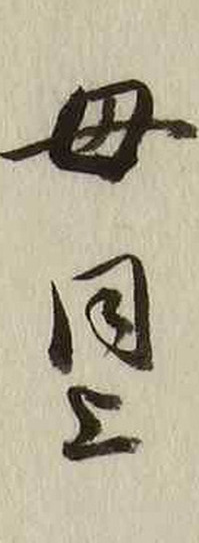母同上
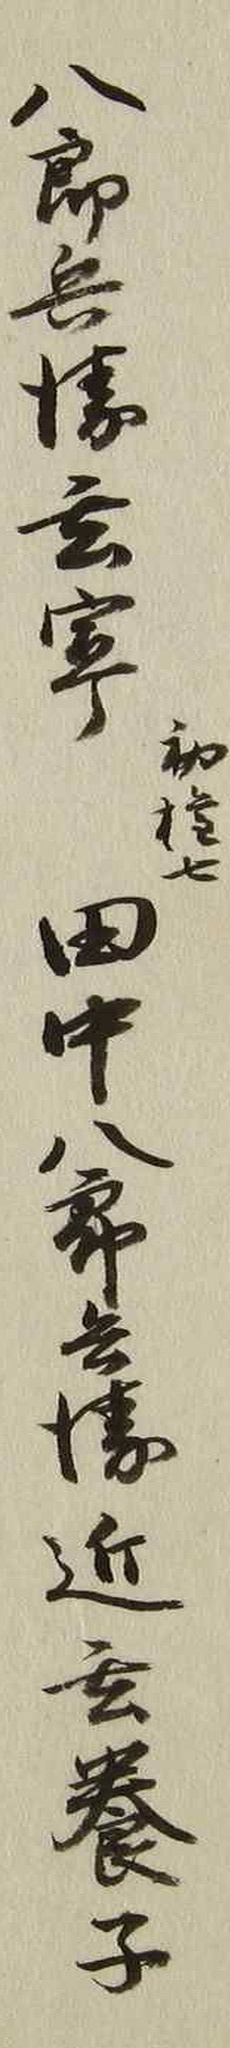八郎兵衛玄寧初権七田中八郎兵衛近玄養子
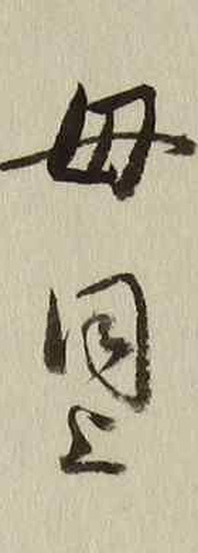母同上
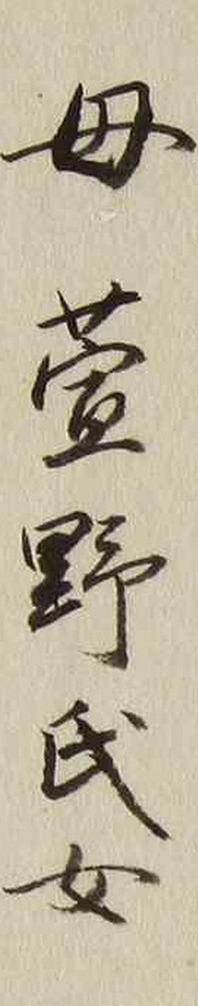母萱野氏女
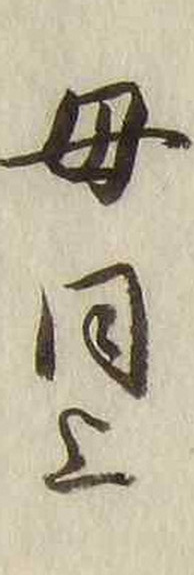母同上

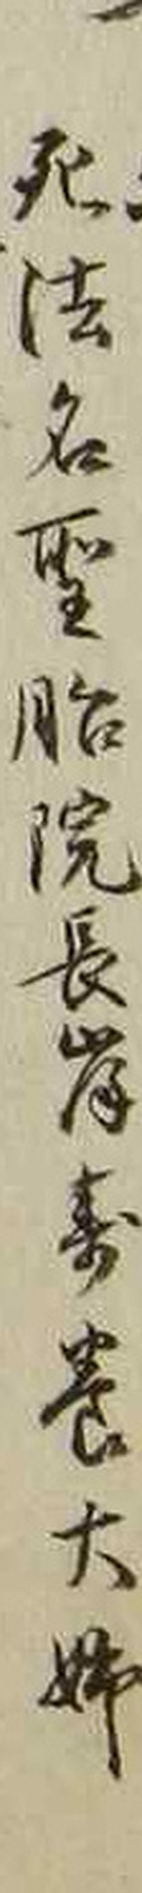死法名聖胎院長岸寿養大姉
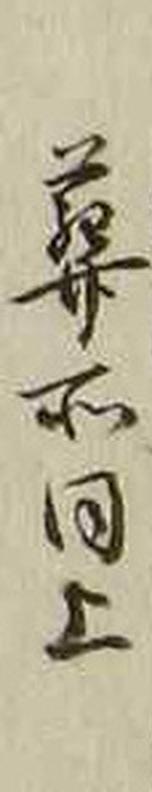葬所同上
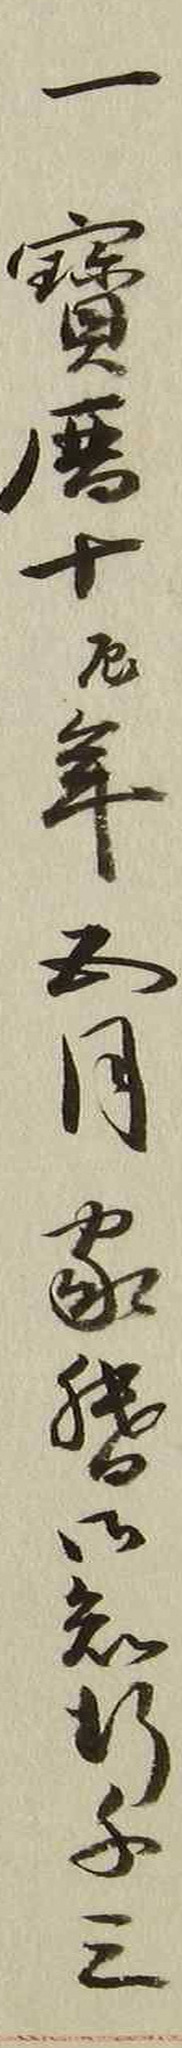一宝暦十辰年五月家督御知行千三
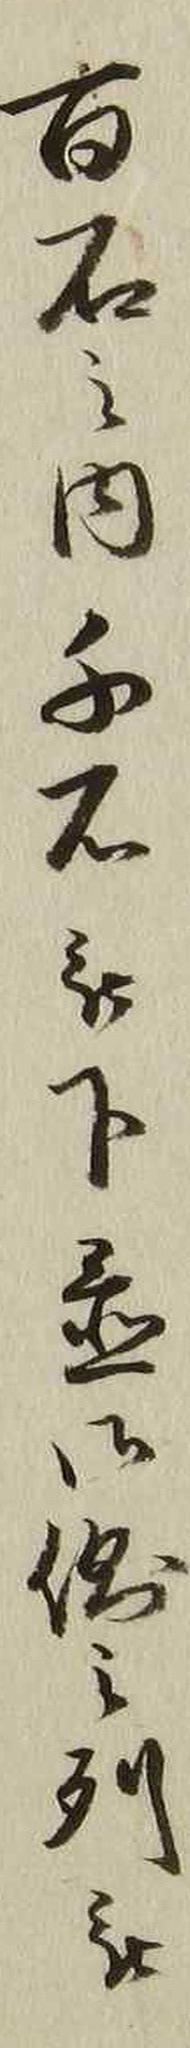百石之内千石被下置御側之列被
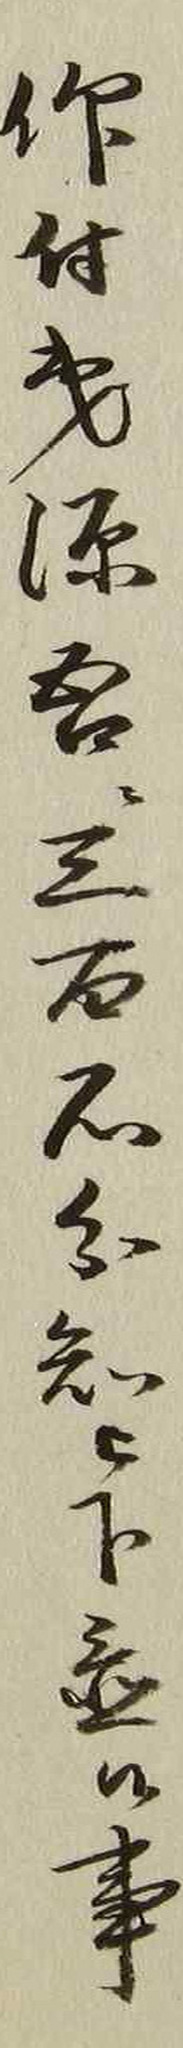仰付弟源吾に三百石分知被下置侯事
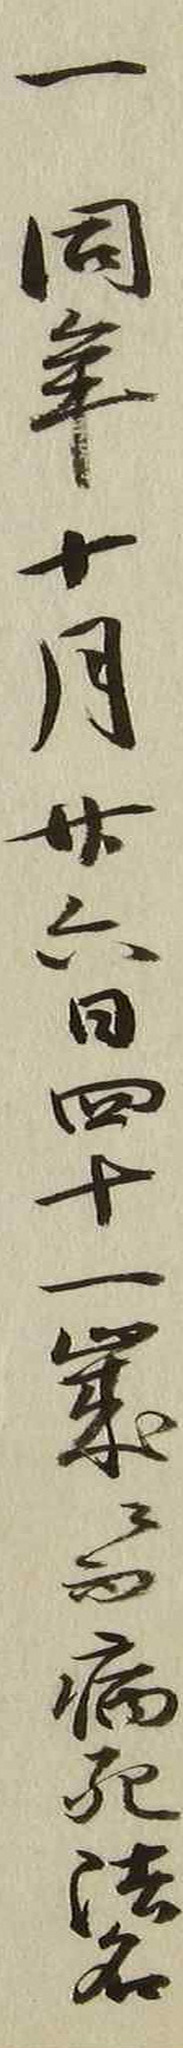一同年十月廿六日四十一歳に而病死法名
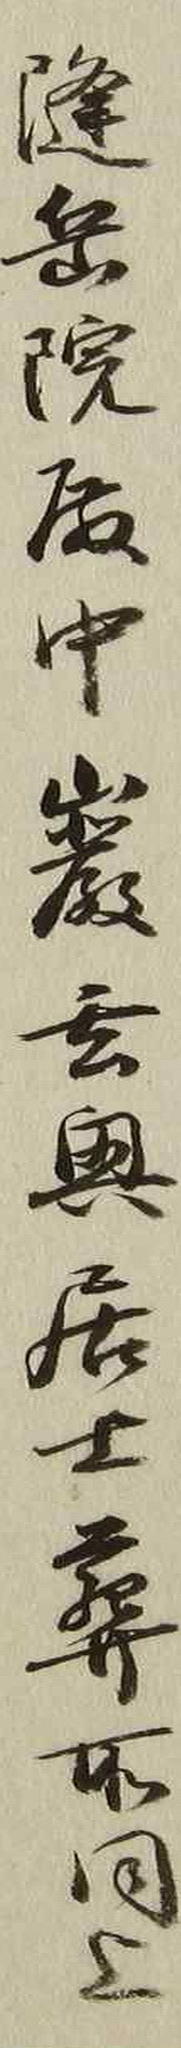逢岳院殿中巌玄興居士葬所同上
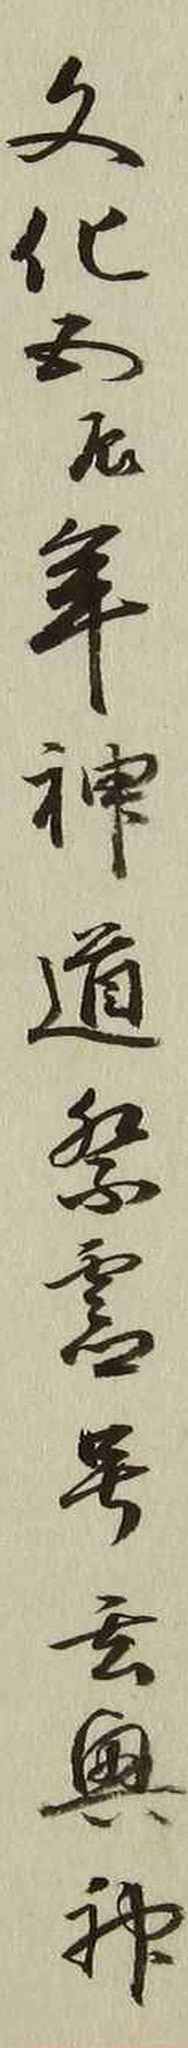文化五辰年神道祭霊号玄興神
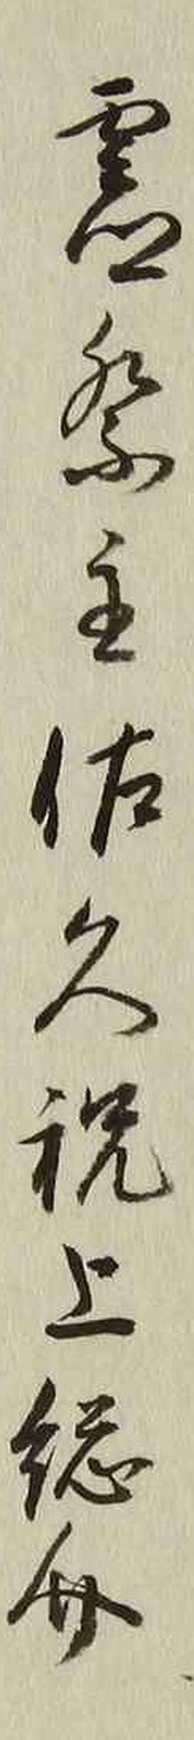霊祭主佐久祝上総介
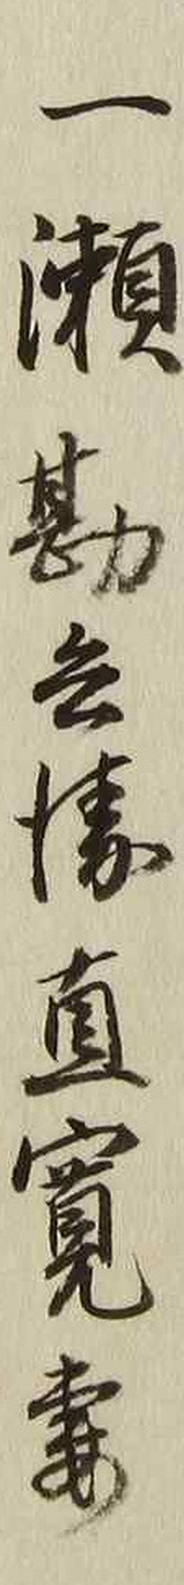女一瀬勘兵場直寛妻
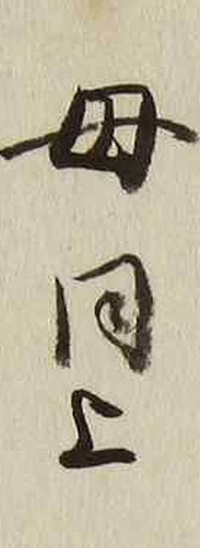母同上
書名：諸士系譜　巻之125　た之部1
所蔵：会津若松市立会津図書館
